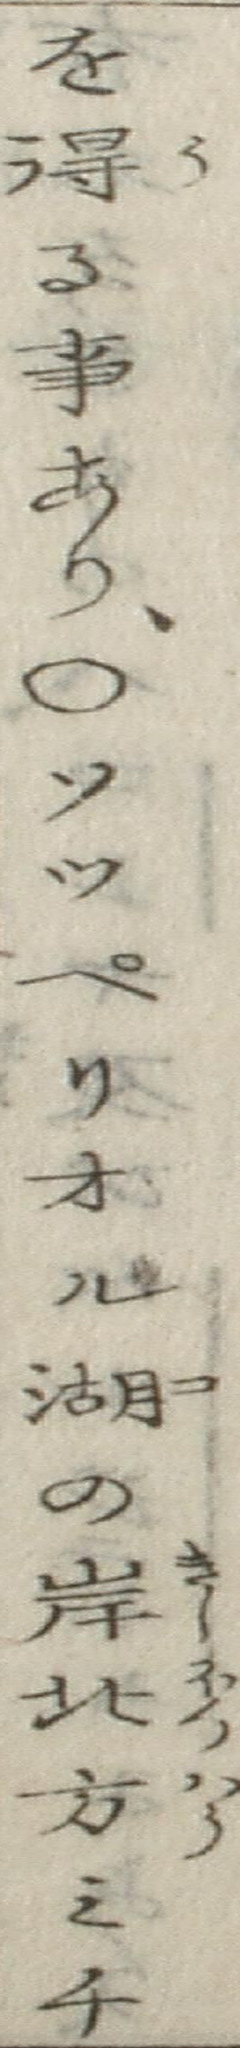を得る事あり、○ソツペリオル湖の岸北方ミチ
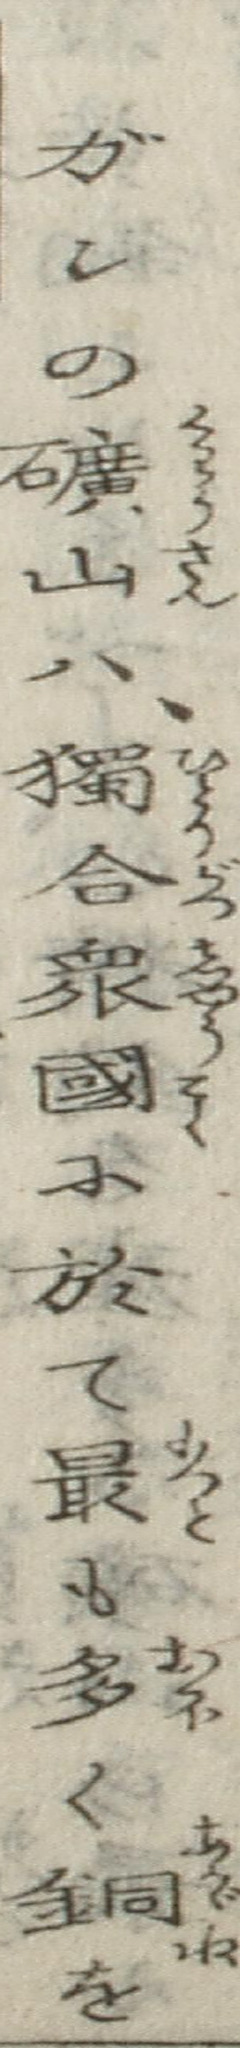ガンの砿山は、独合衆国に於て最も多く銅を
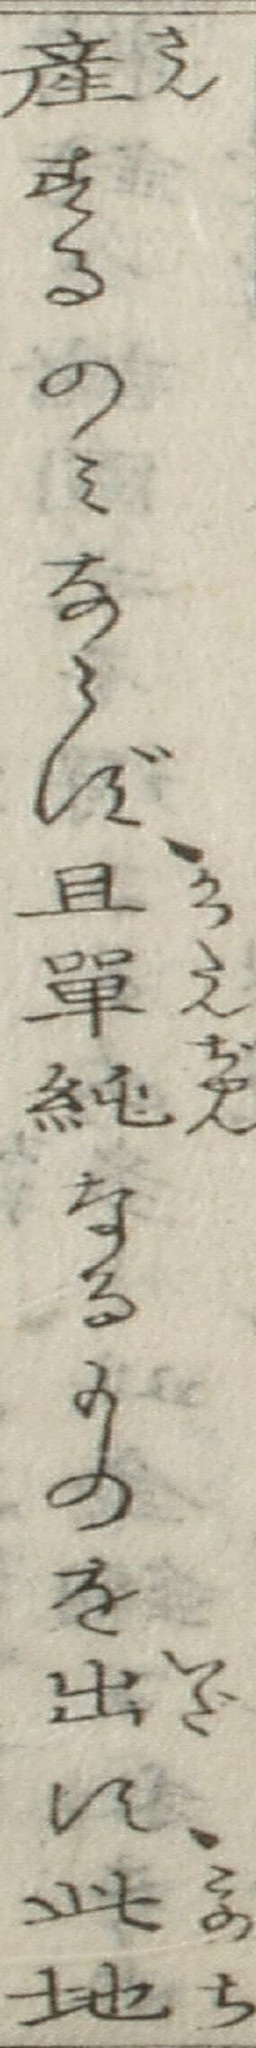産ずるのみならず、且単純なるものを出す、此地
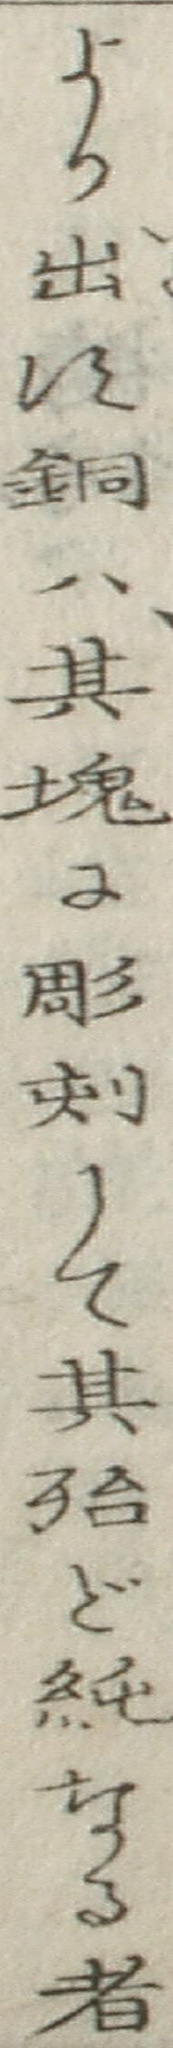より出す銅は、其塊に彫刻して殆ど純なる者
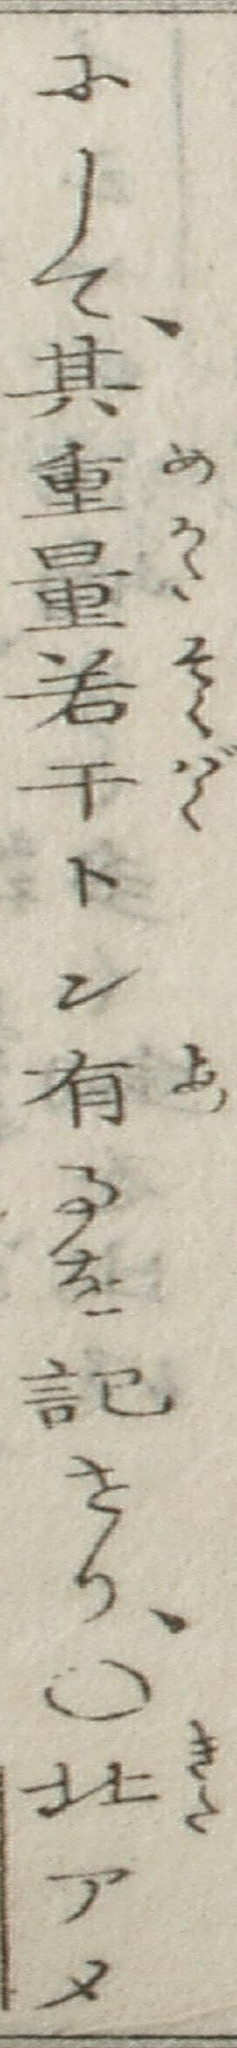にして、其重量若干トン有るを記せり、○北アメ
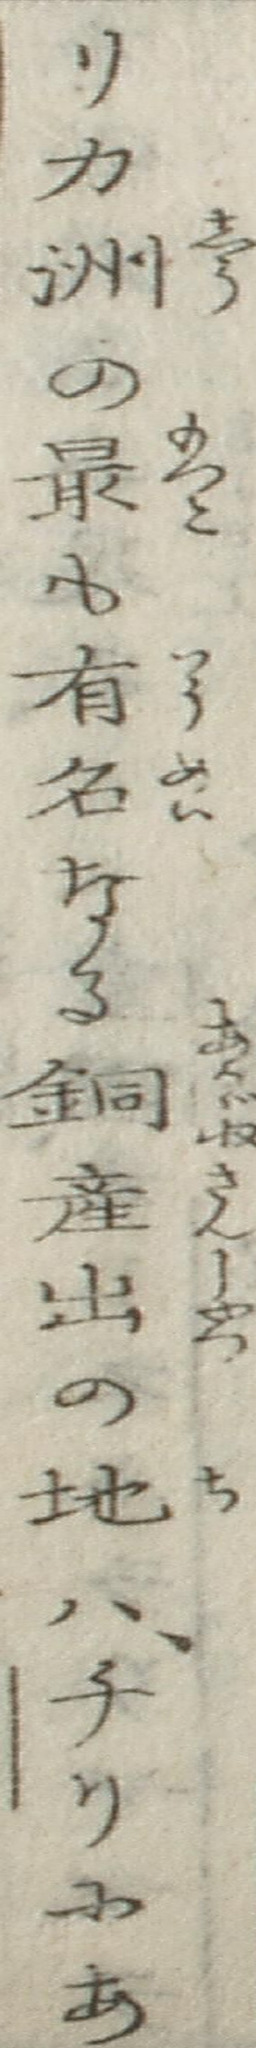リカ洲の最も有名なる銅産出の地は、チリにあ
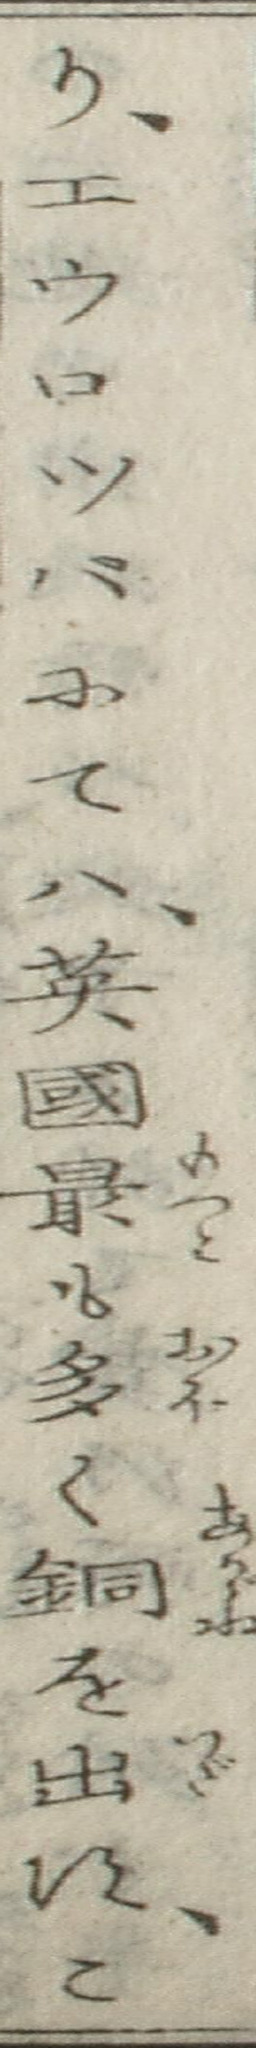り、エウロツパにては、英國最も多く銅を出す、こ

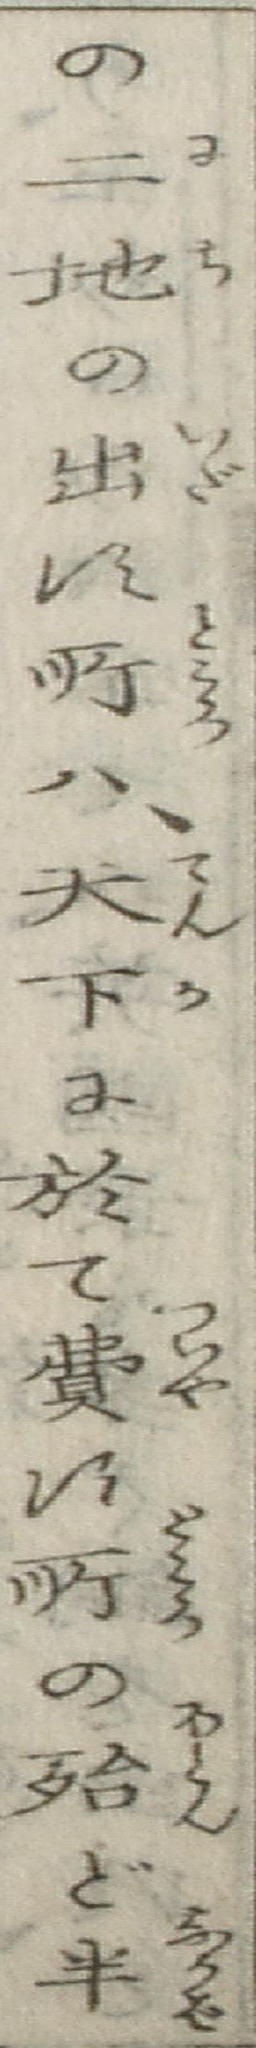の二地の出す所は、天下に於て費す所の殆ど半
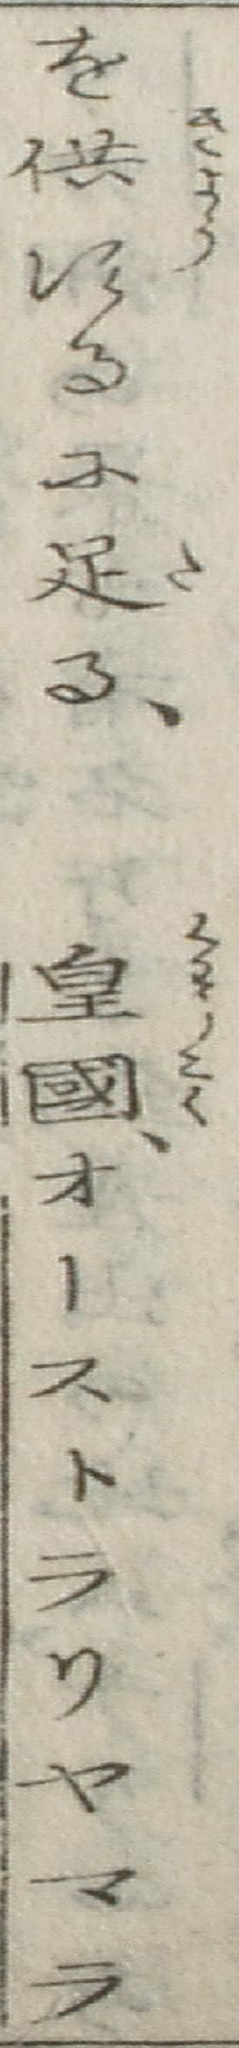を供するに足る、皇国、オーストラリヤマラ
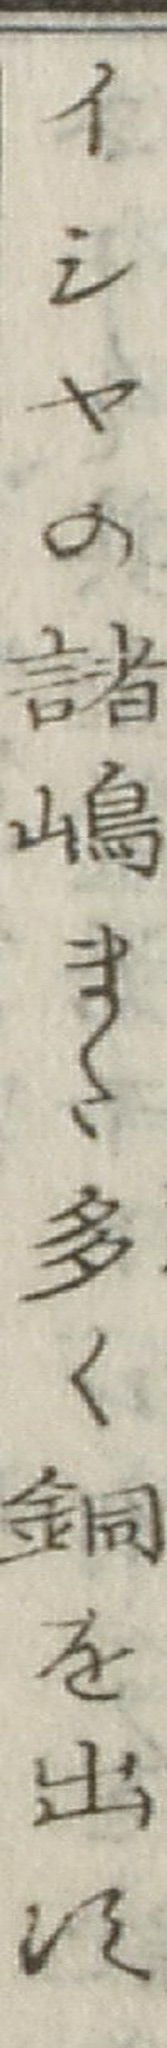イシヤの諸島、また多く銅を出す
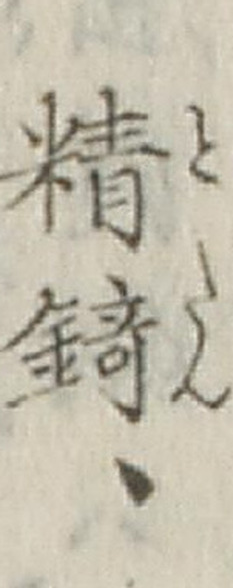精錡、
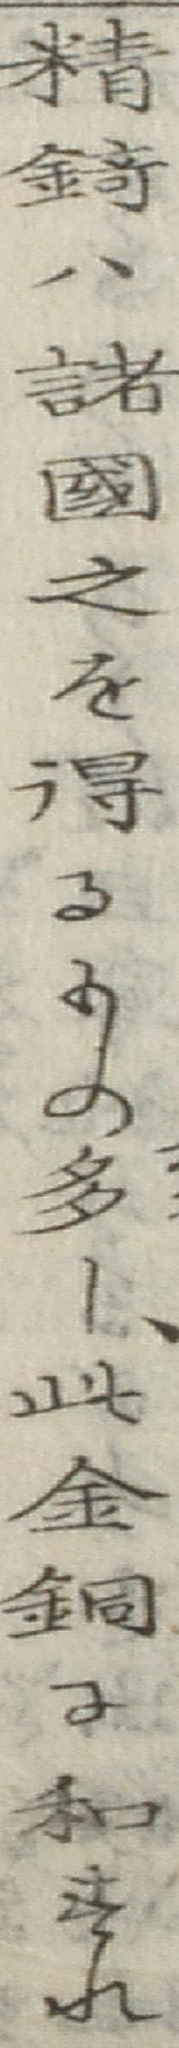精錡は諸国之を得るもの多し、此金銅に和すれ
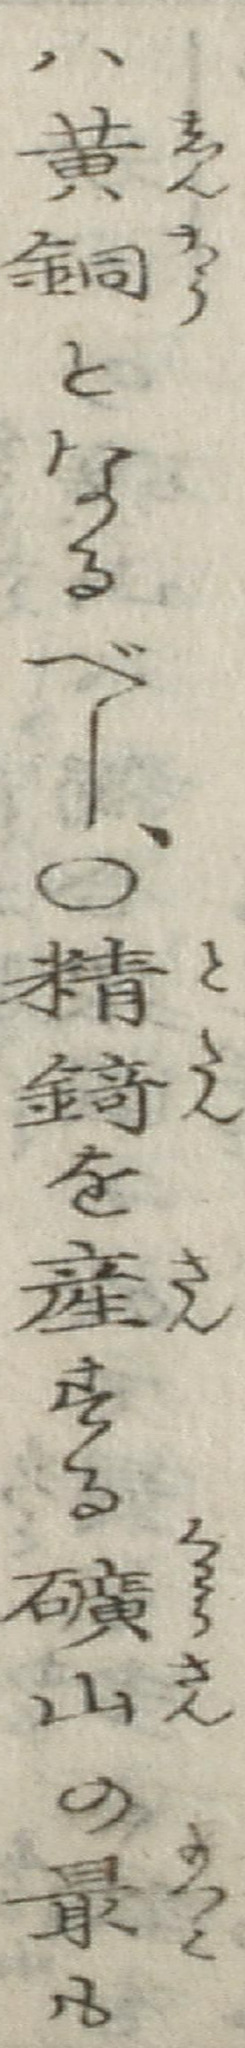は黄銅となるべし、○精錡を産する砿山の最も
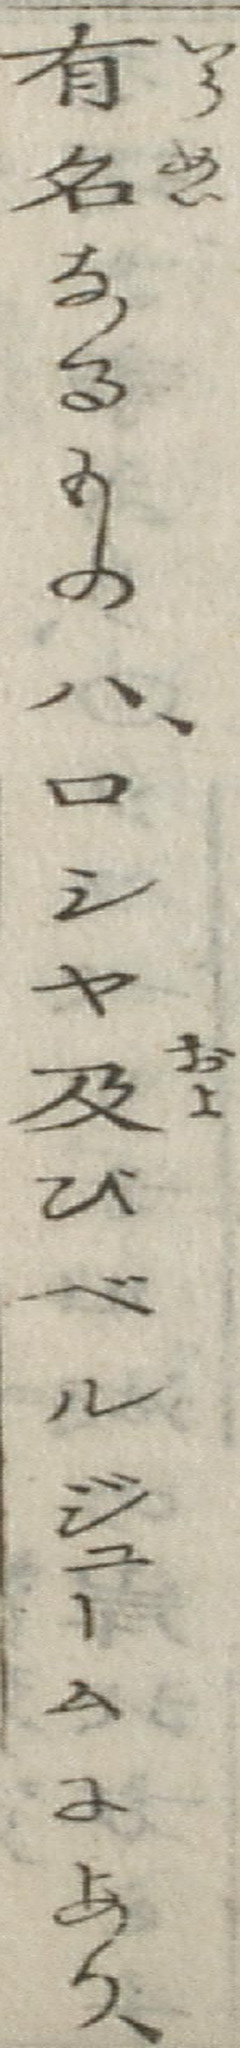有名なるものは、ロシヤ及びベルジュームにあり、
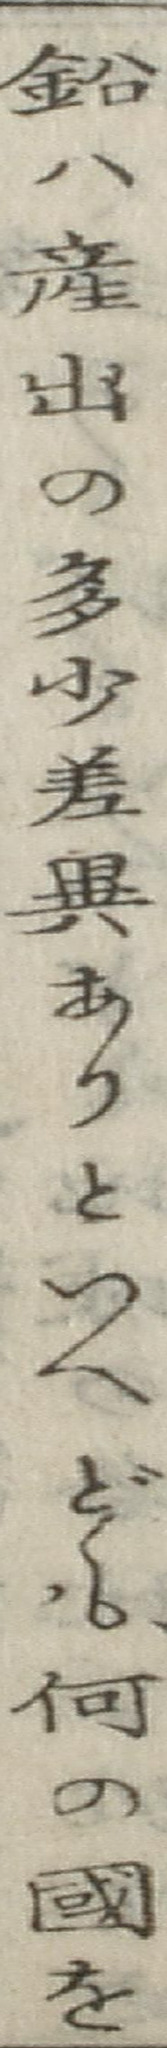鉛は産出の多少差異ありといへども、何の国を
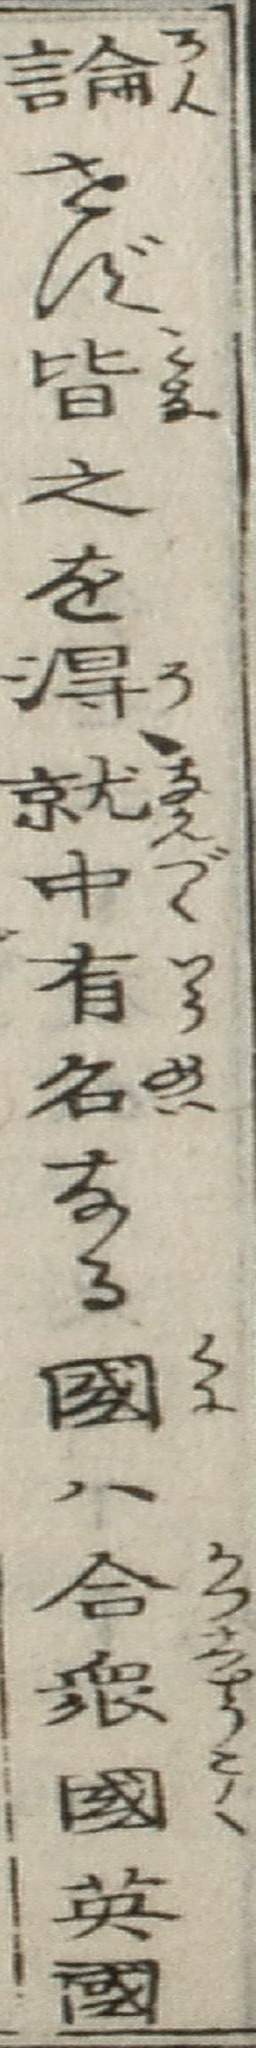論せず、皆之を得、就中有名なる国は合衆国英国
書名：訓蒙　天然地理學　下
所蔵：東京大学地震研究所図書室 Earthquake Research Institute Library, The University of Tokyo, JAPAN
